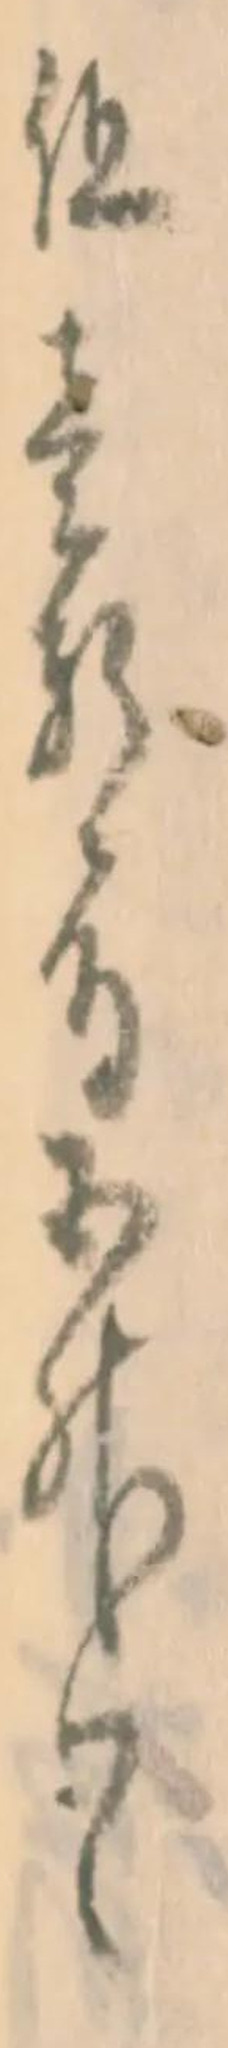但壱軒ニ付五升ツヽ
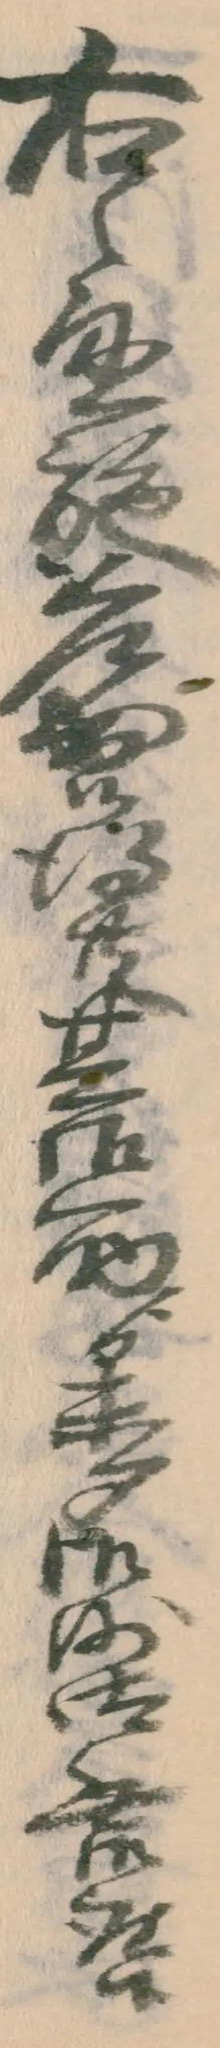右之通施差出候得共其御筋ゟ未タ御沙汰無御座候
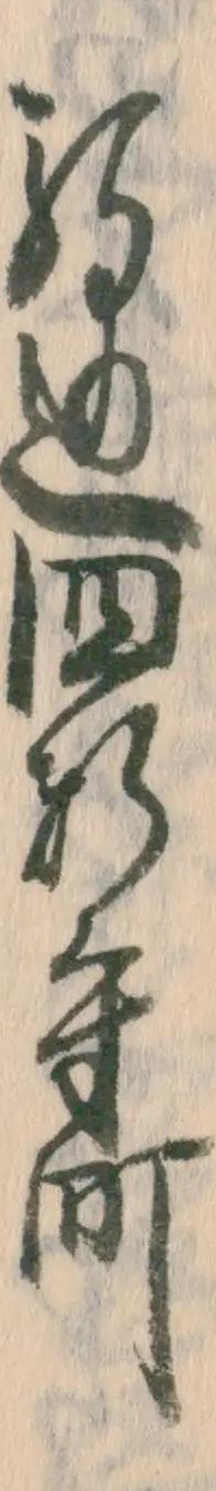駒込四軒寺町
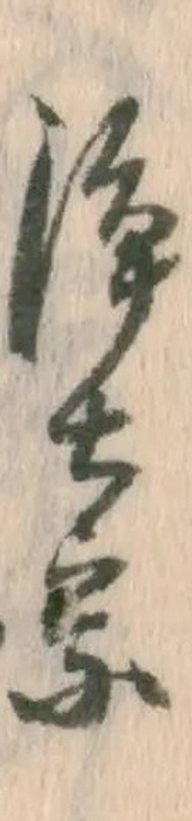浄土宗
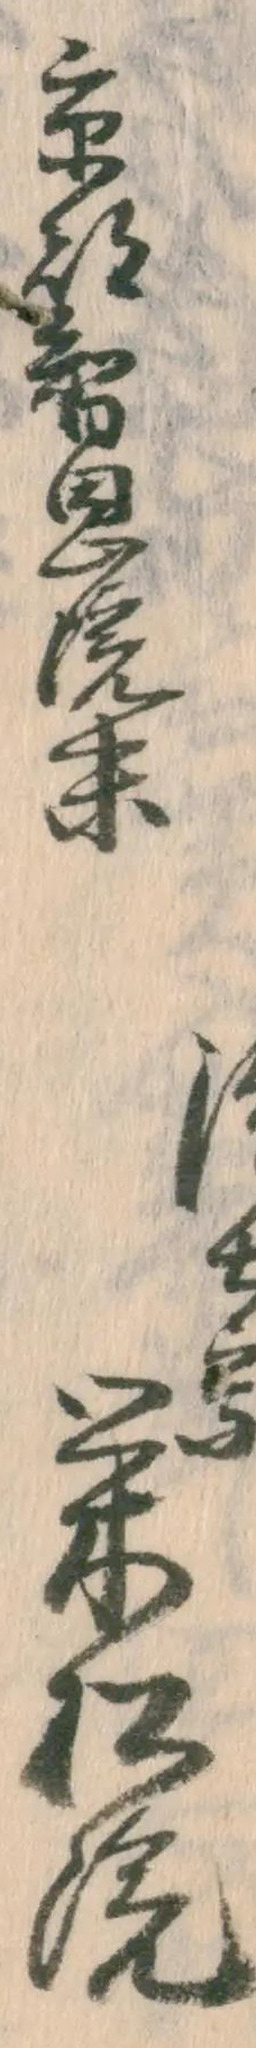京都知恩院末栄松院
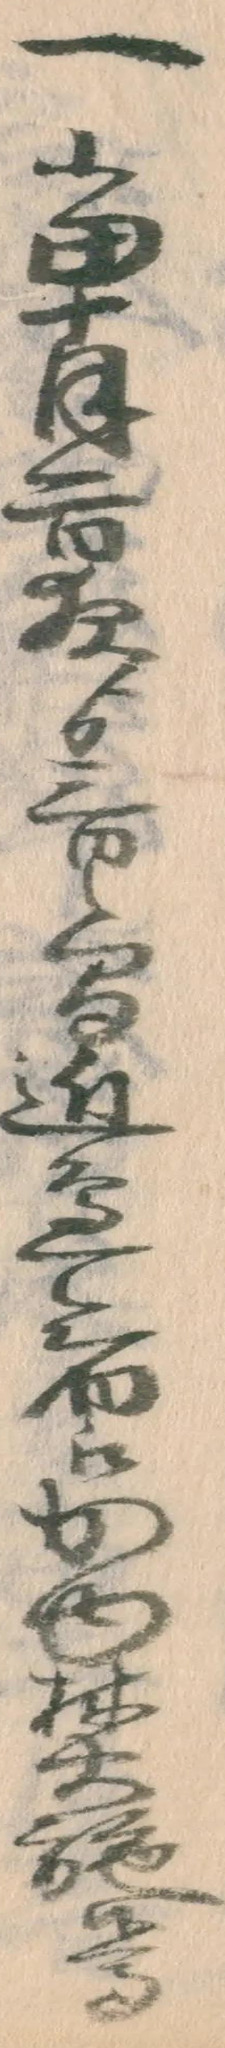一当十月二日夜ゟ三日之間近辺之者えかゆ焚施候高
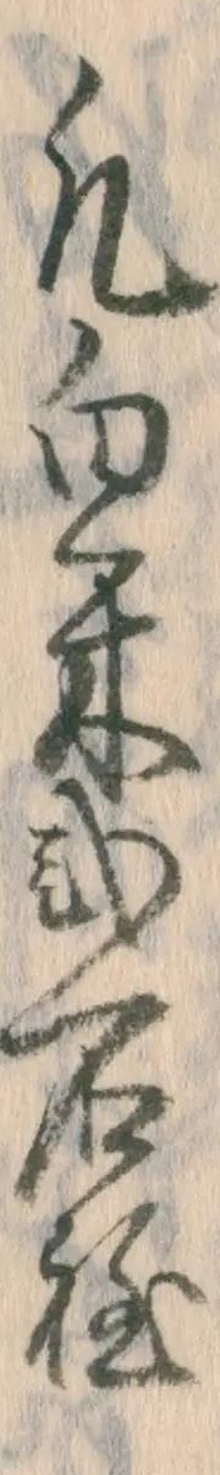凡白米弐石程
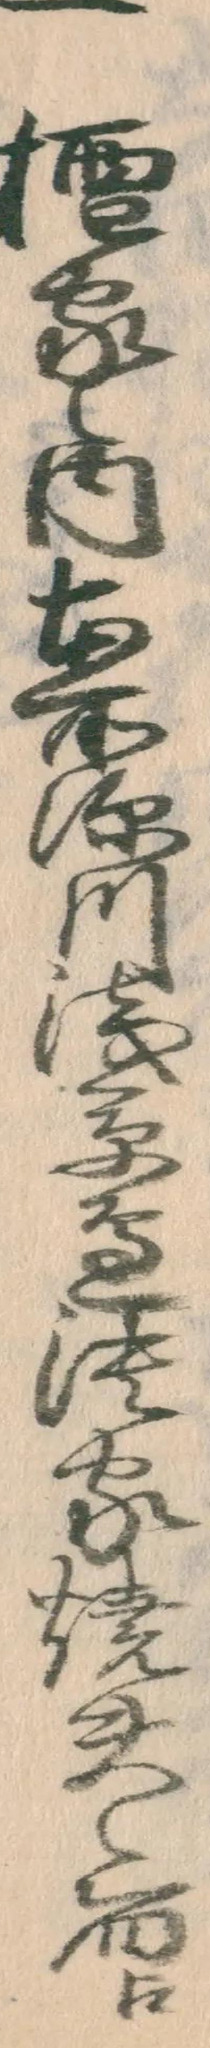一檀家之内本所深川浅草辺潰家焼失之者え
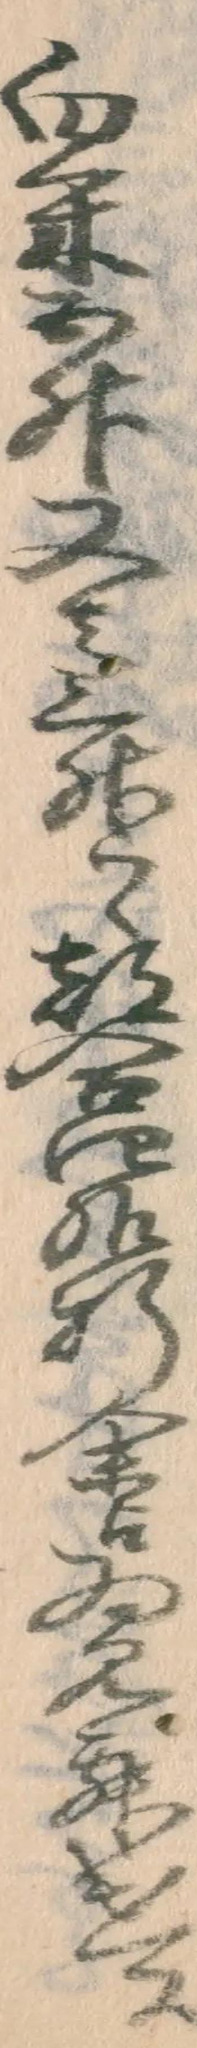白米五升又は三升ツヽ都合四拾軒余え為見舞遣ス

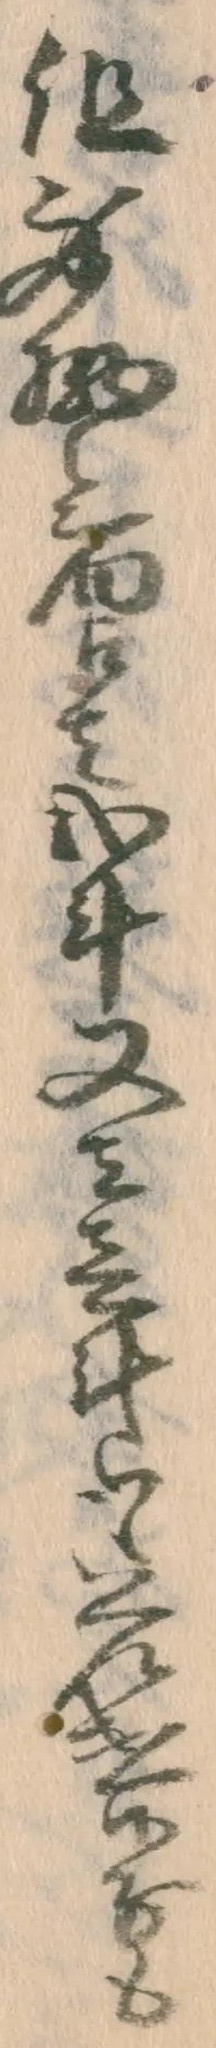但身柄之者えは弐斗又は壱斗ツヽ差遣候分も
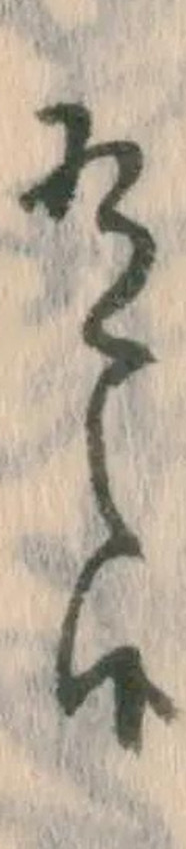有之候
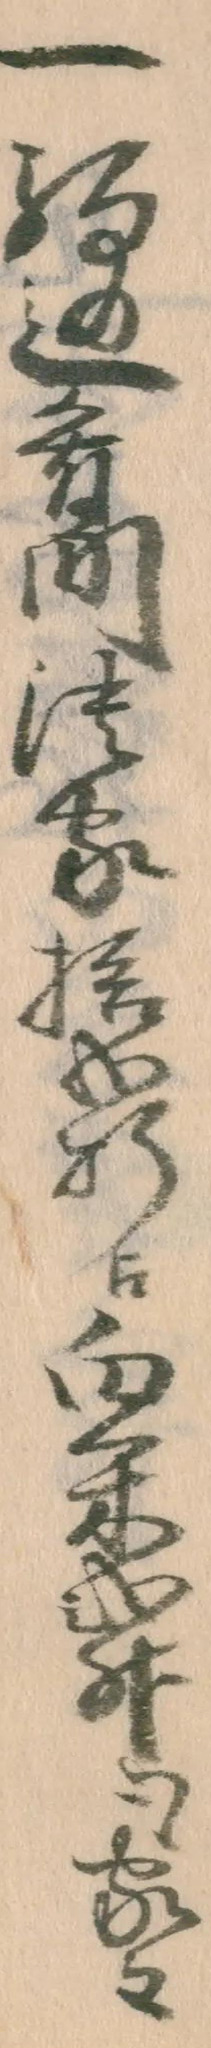一駒込肴町潰家拾弐軒え白米弐升ツヽ家主
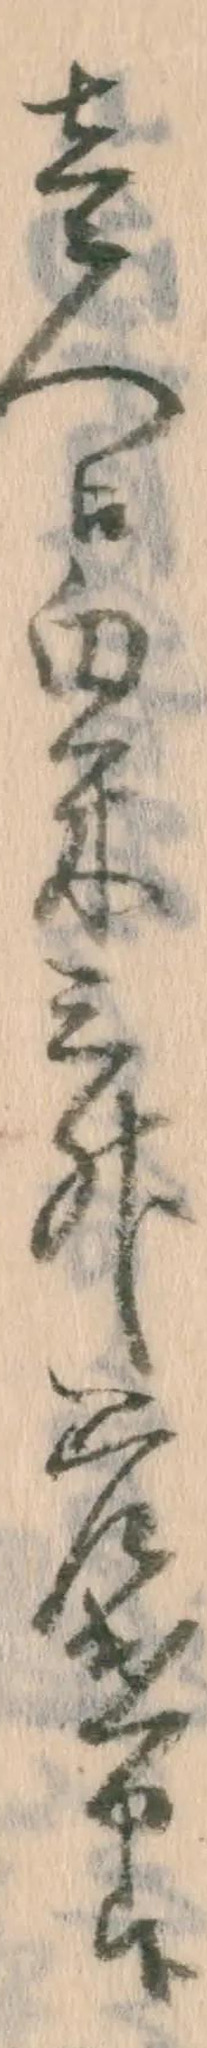壱人え白米三升差遣申候
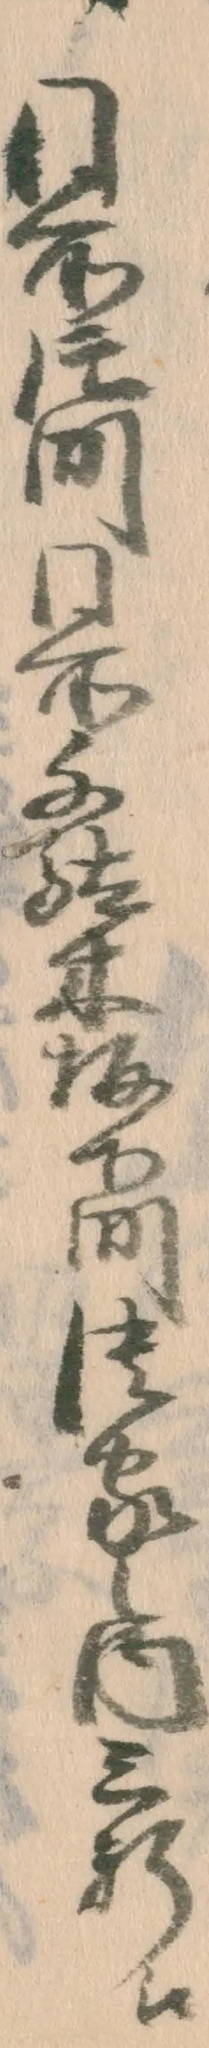一同所片町同所千駄木坂下町潰家之内三軒え
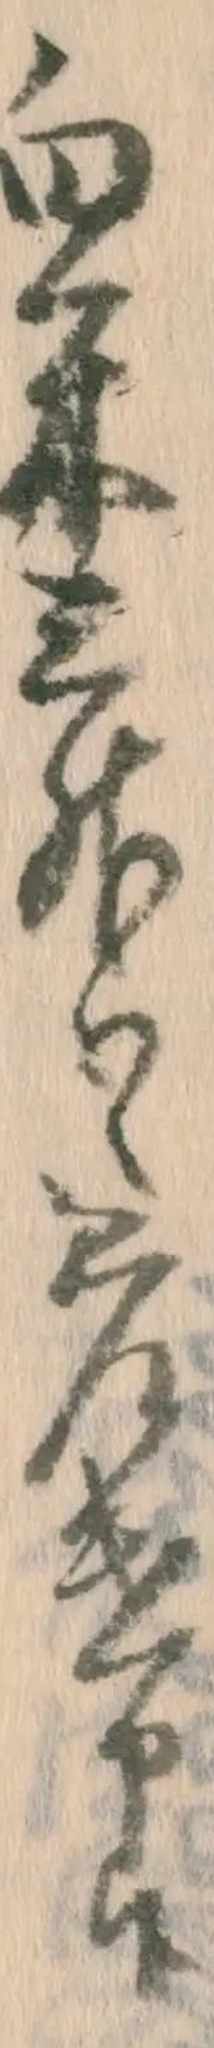白米三升ツヽ差遣申候
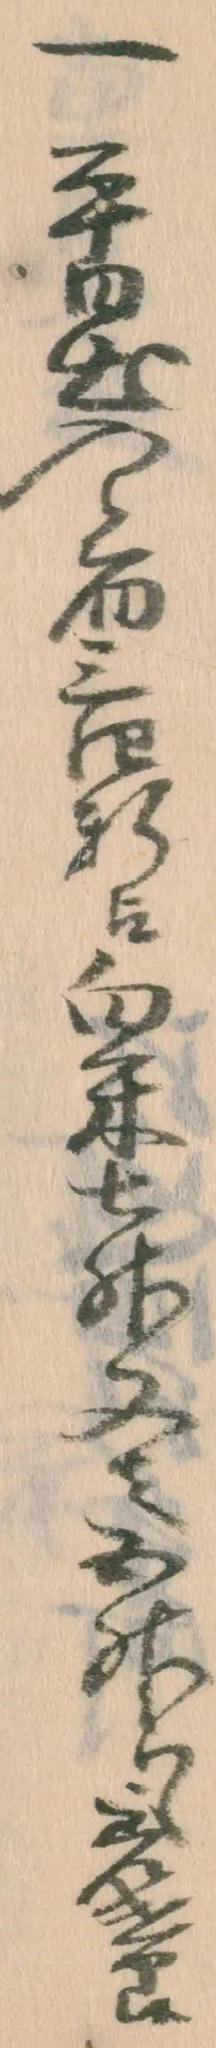一平日出入之者三四軒え白米七升又は五升ツヽ差遣申候
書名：武家方并寺院等ニテ施差出候一件
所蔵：国立国会図書館 National Diet Library, JAPAN
